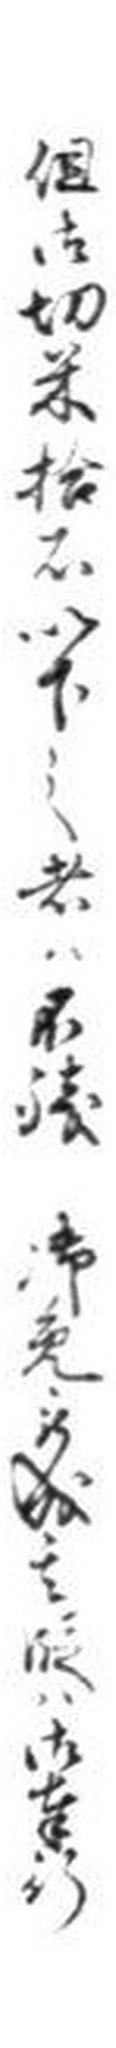但御切米拾石以下之者は不残御免被成其段は御奉行
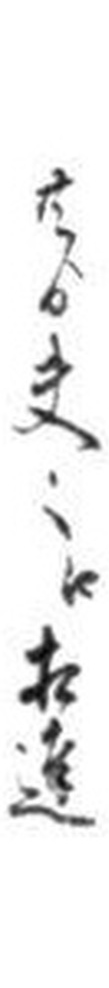共ゟ夫々江相達
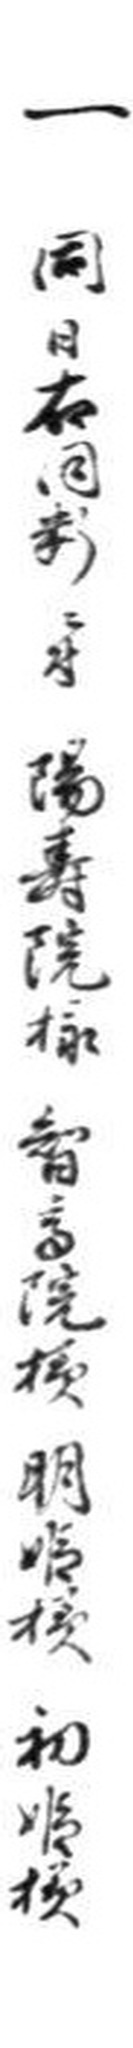一同日右同断ニ付陽寿院様智高院様朋姫様初姫様
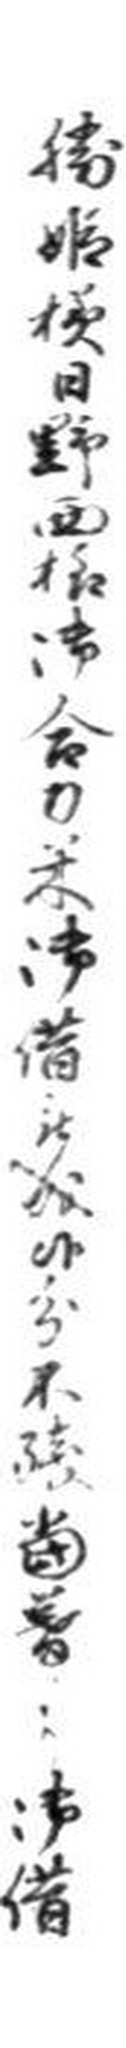勝姫様日野西様御合力米御借被成候分不残当暮之御借
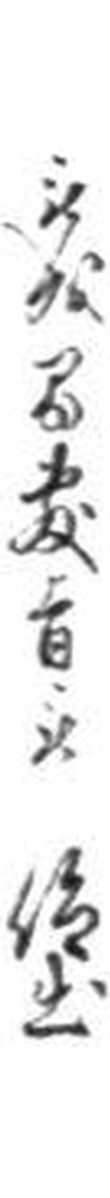被成間敷旨被仰出
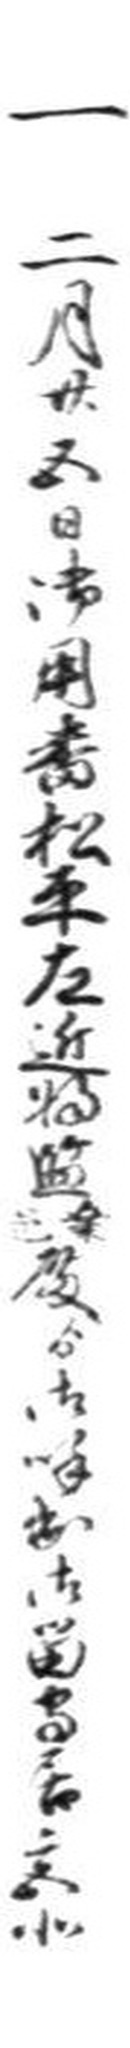一二月廿五日御用番松平左近将監乗邑殿ゟ御呼出御留守居宮北
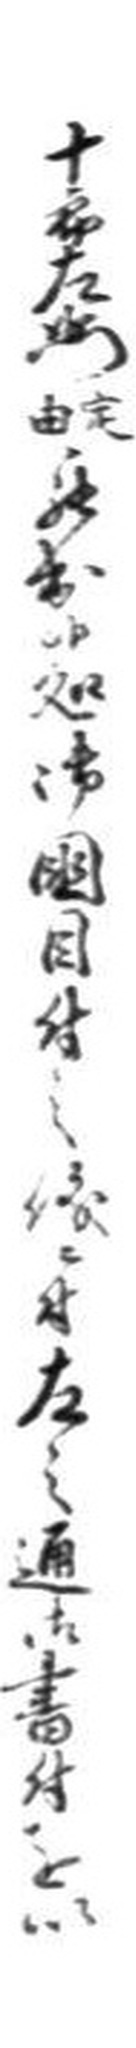十郎左衛門定由罷出候処御国目付之儀ニ付左之通御書付を以
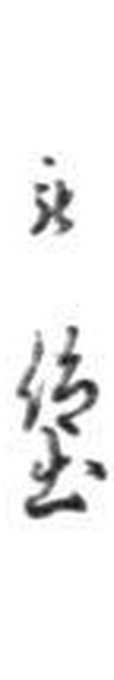被仰出
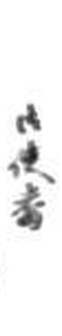御使者
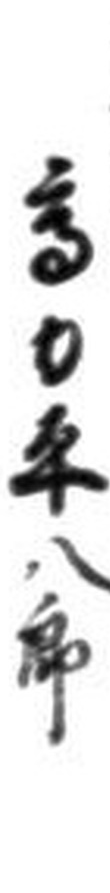高力平八郎
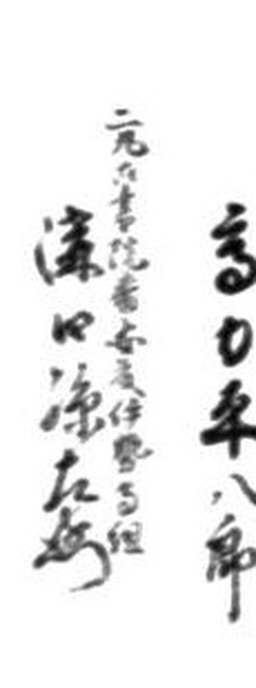二丸御書院番安藤伊勢守組
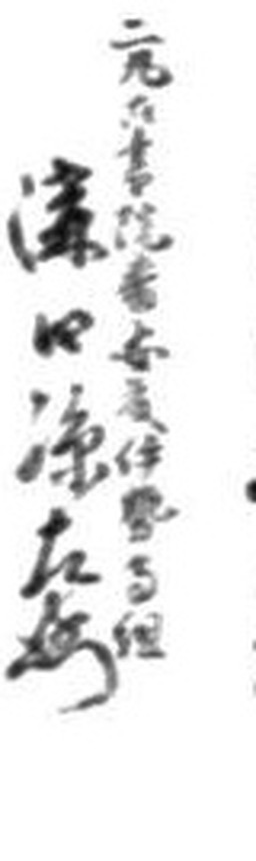溝江源左衛門
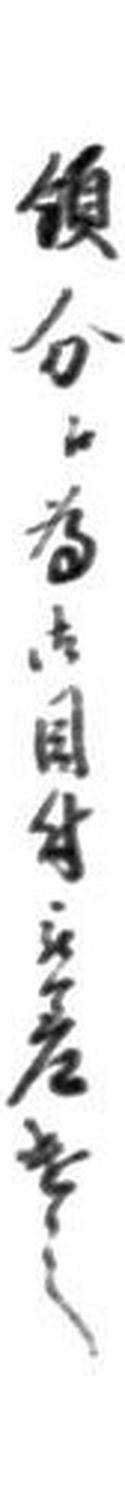領分江為御目付被差遣之
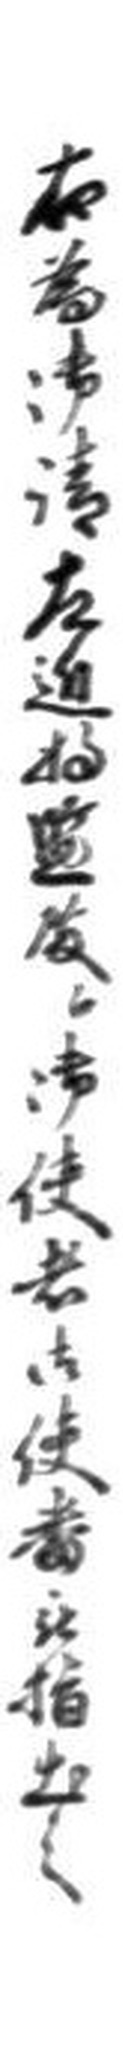右為御請左近将監殿江御使者御使番被指出之
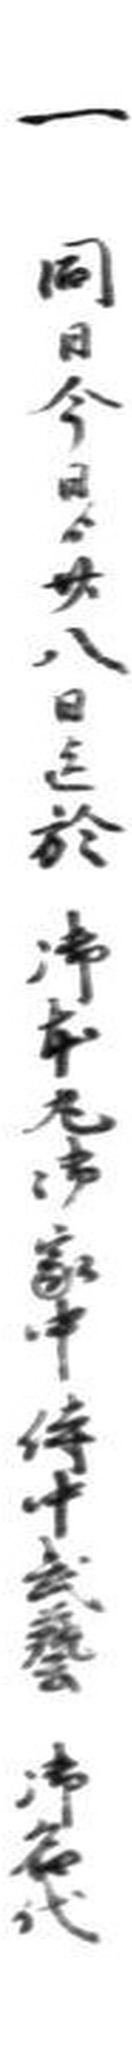一同日今日ゟ廿八日迄於御本丸御家中侍中武芸御名代
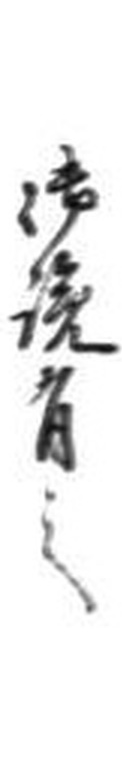御読有之
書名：家譜 三十九 宗矩公 享保十年
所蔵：福井県文書館 Fukui Prefectural Archives
